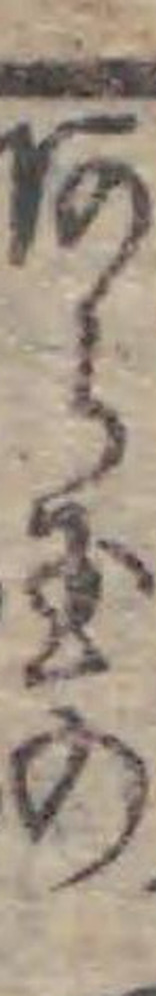あら玉の
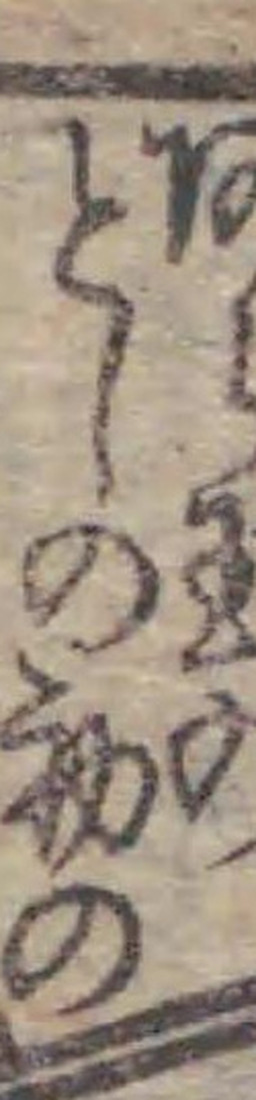としの初の
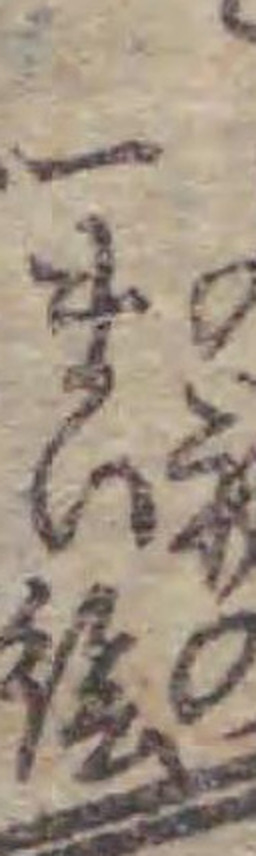一まい絵
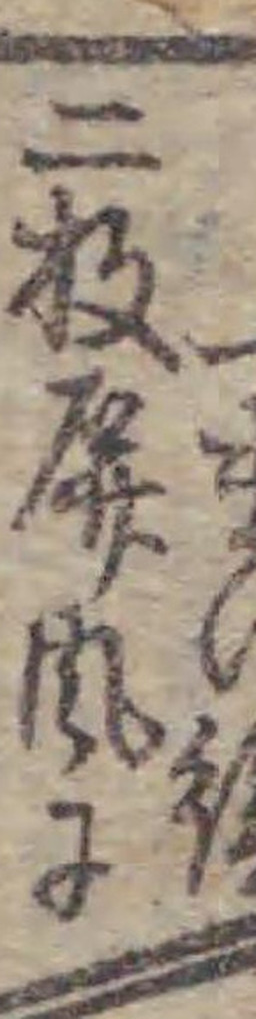二枚屏風に
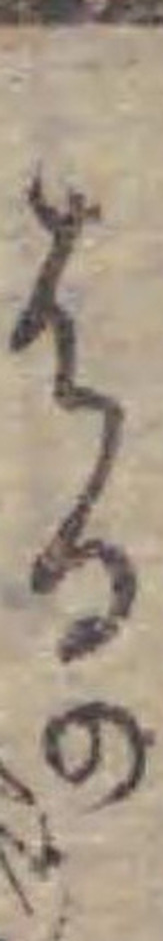はるの
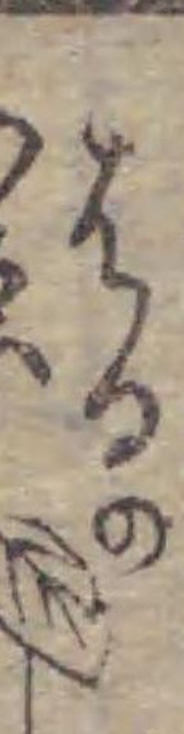はるの
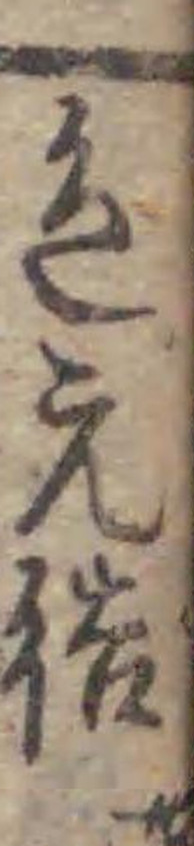色元結
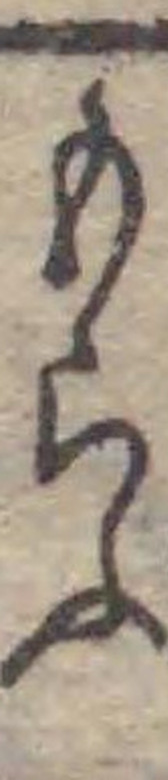もらふ
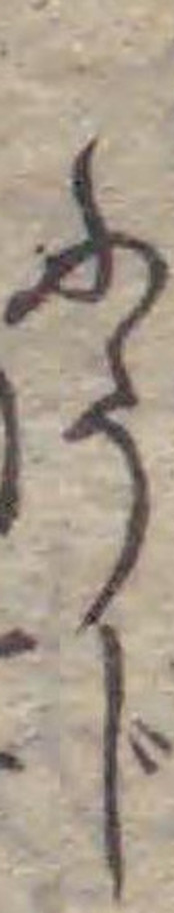ふうじ
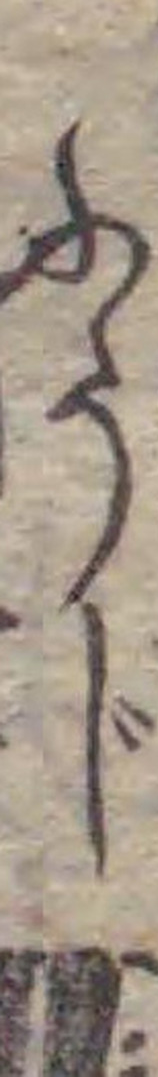ふうじ
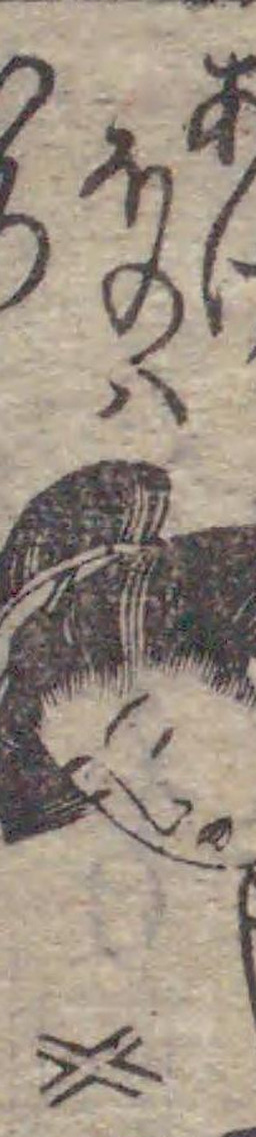ほのは
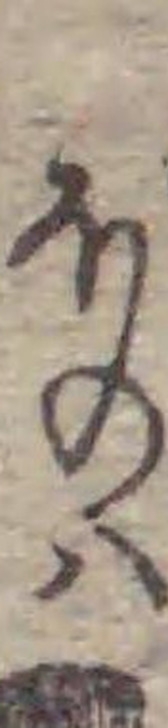ほのは
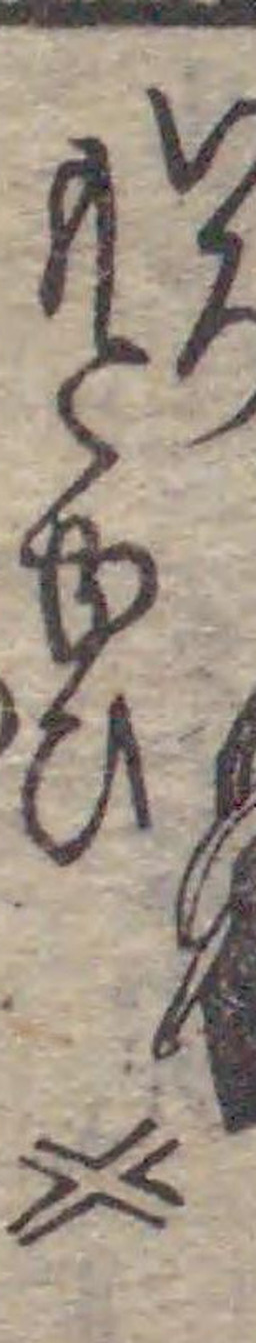もとゆひ
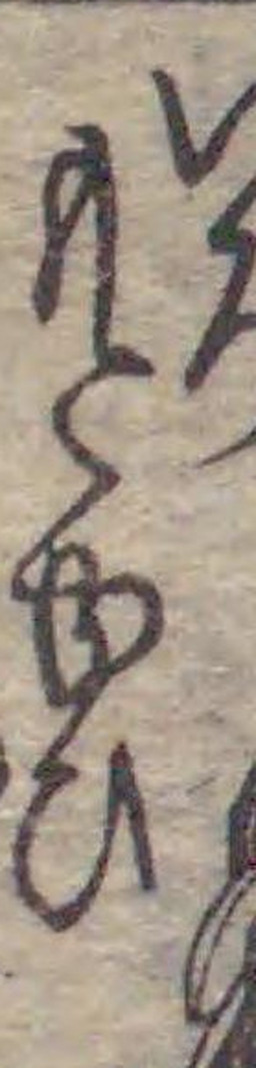もとゆひ

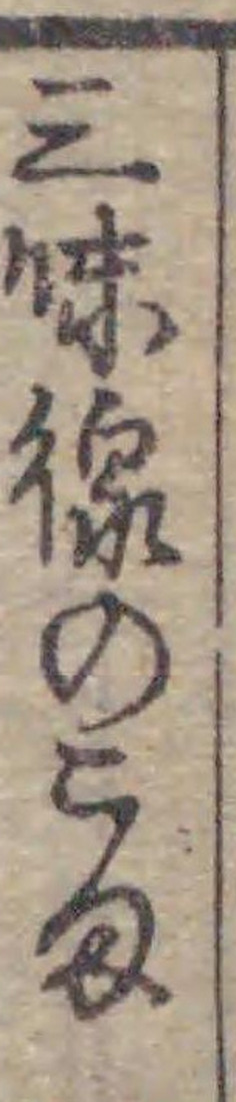三味線のこま
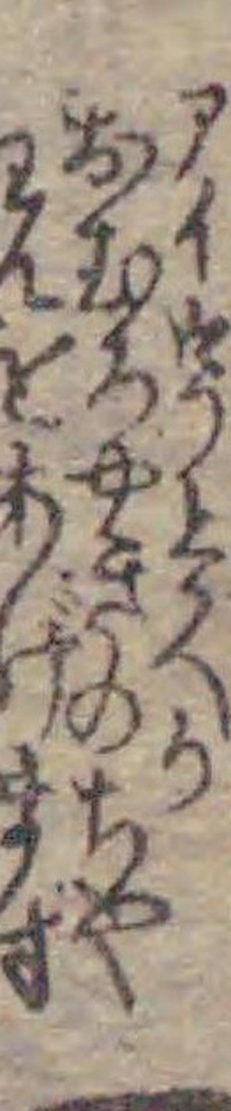おむろやきのちや
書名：年始御礼帳 : 3巻
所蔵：国立国会図書館 National Diet Library, JAPAN
